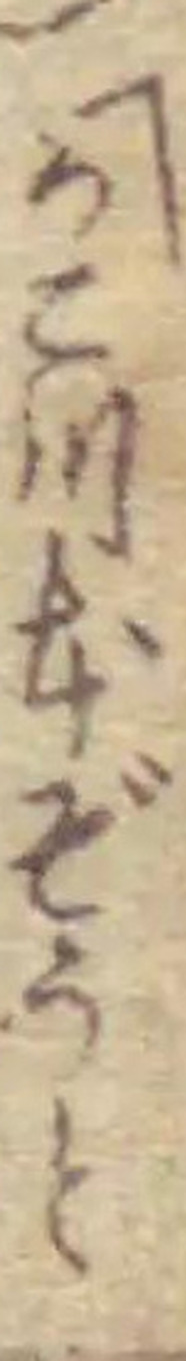〽かこ川本ぞうと
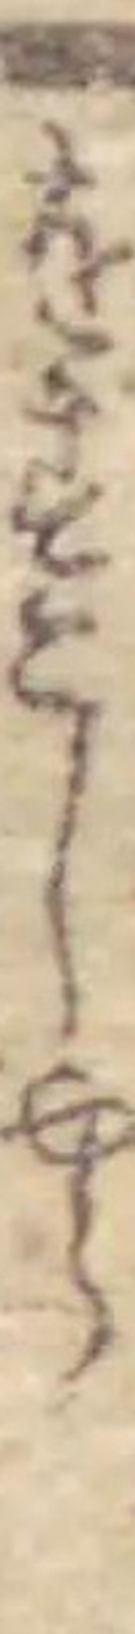をすこしやら
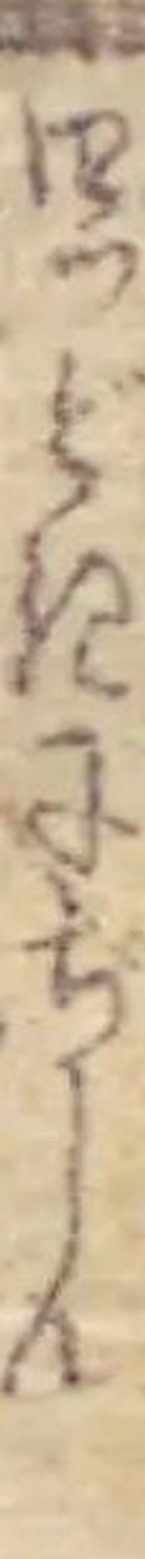四つどきにぢしん
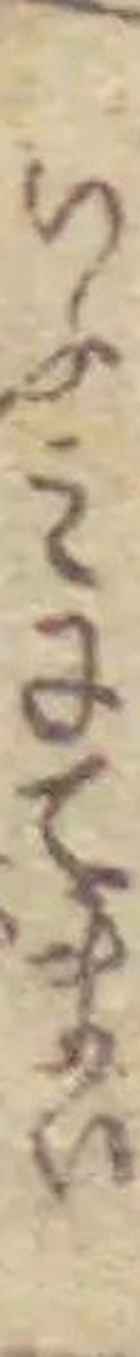いふみにてまい
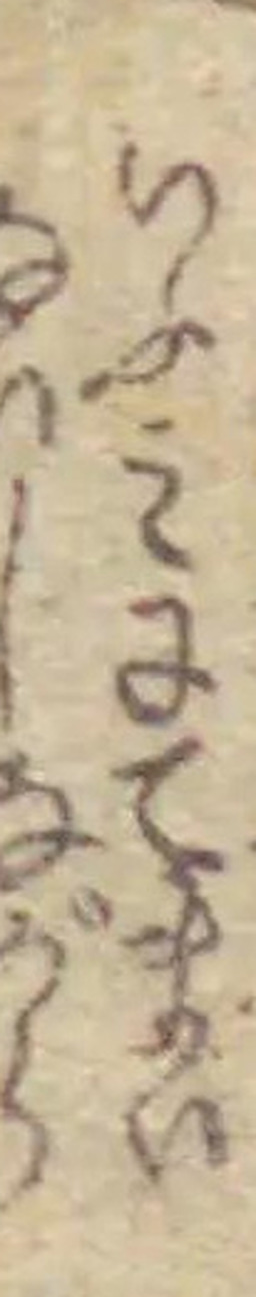ないしながら
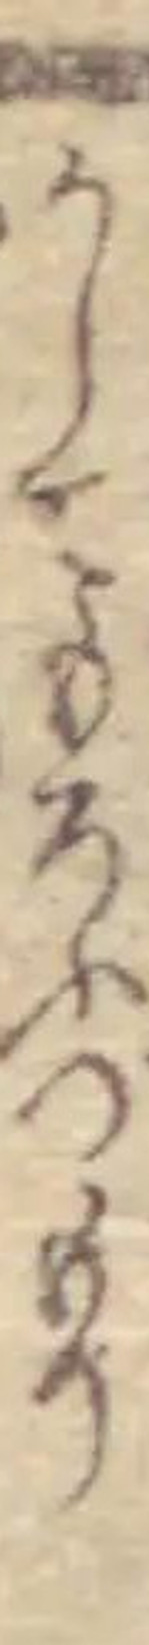かしてもろふつもり
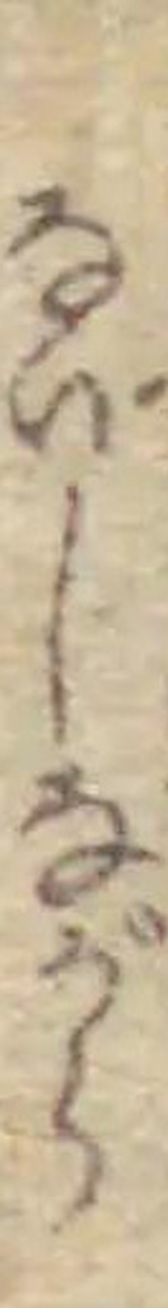ないしながら
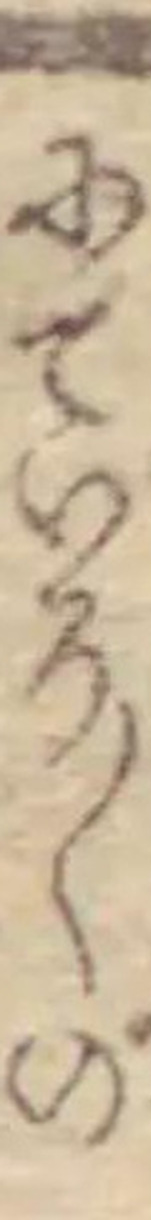にていろ〳〵の
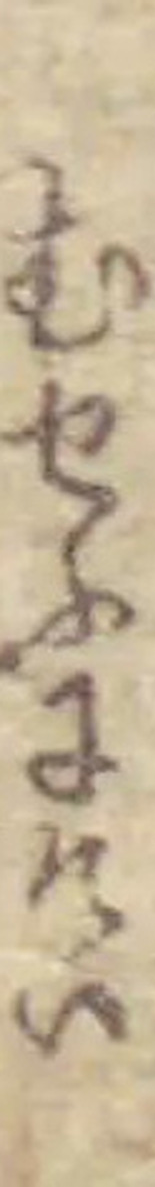むせふにけい
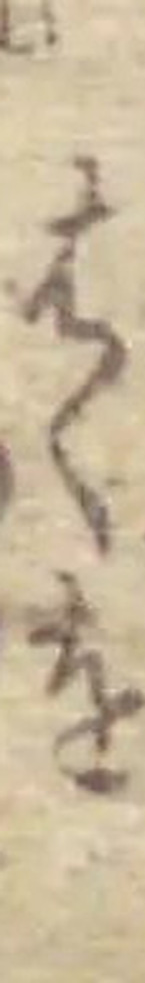はくを
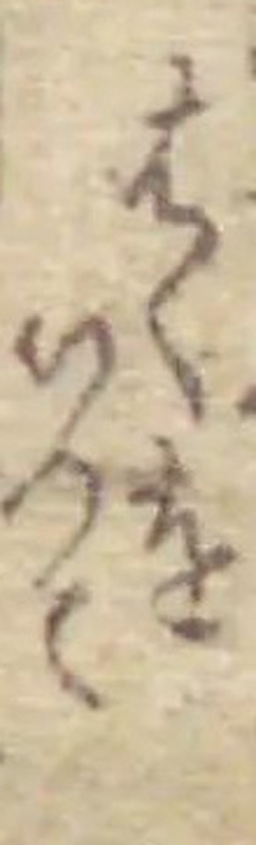いつて
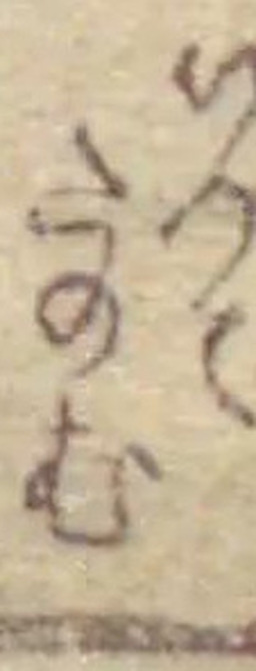たのむ
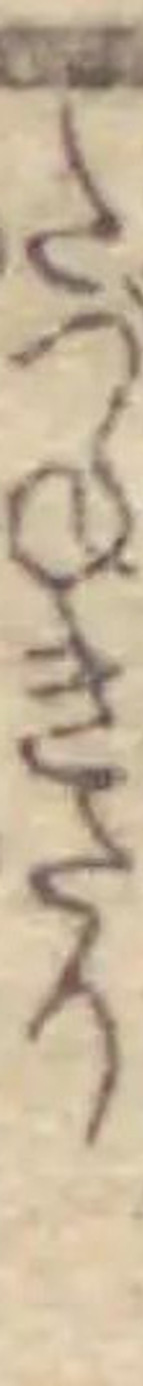たづねきたり
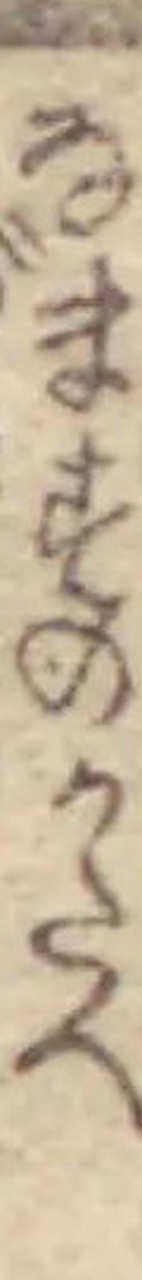なまずのかたへ
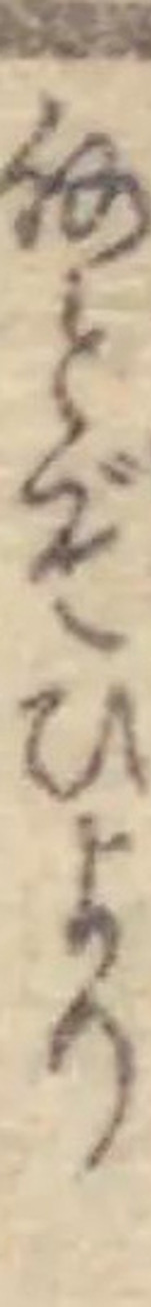何とぞひより
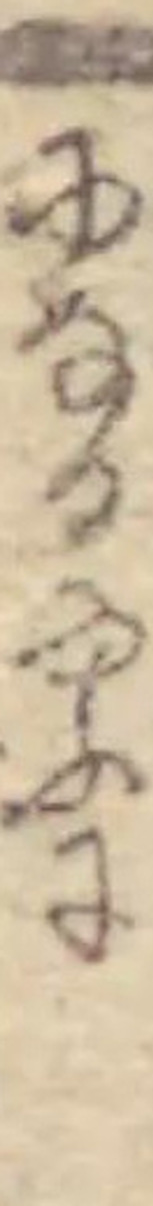になるやふに
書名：雨宮風宮出儘略縁記 3巻
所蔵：国立国会図書館 National Diet Library, JAPAN
